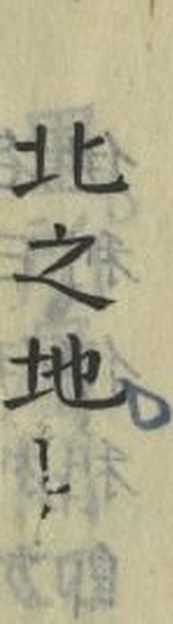北之地。
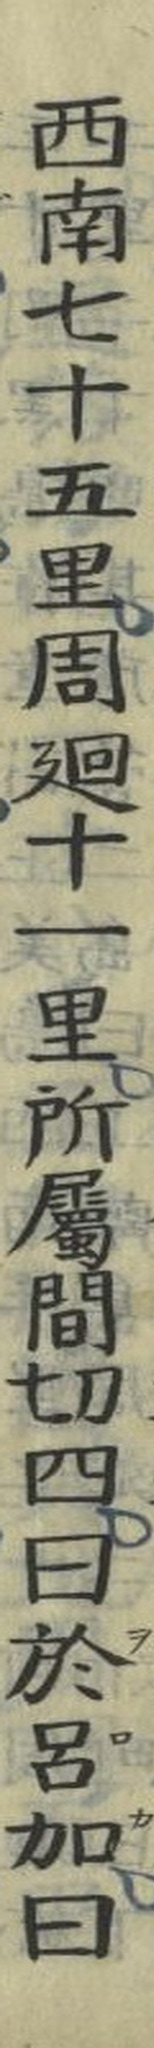西南七十五里。周廻十一里。所屬間切四。曰於呂加。曰
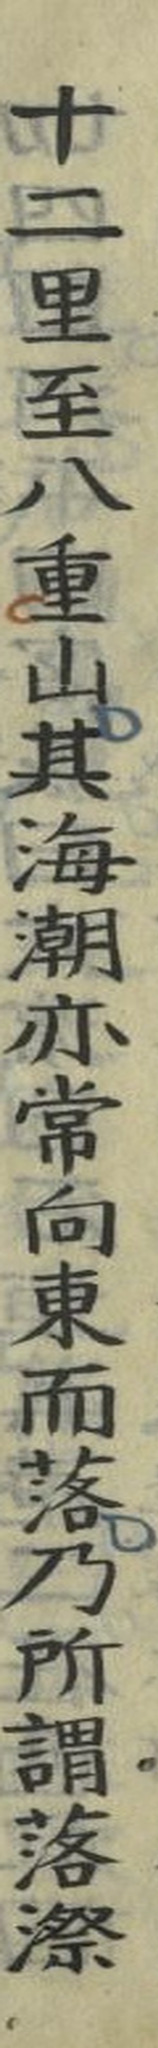十二里至八重山。其海潮亦常向東而落。乃所謂落漈
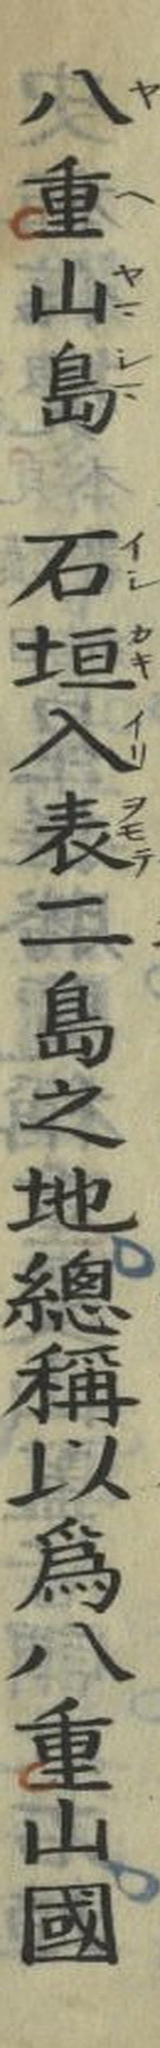八重山島石垣入表二島之地。總稱以爲八重山。國

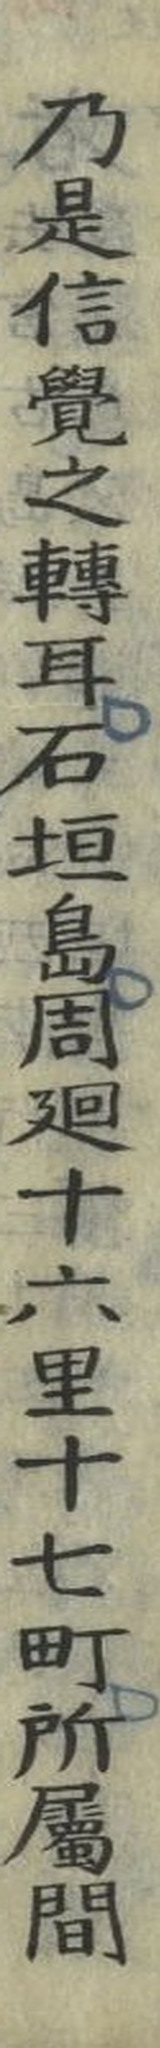乃是信覺之轉耳。石垣島。周廻十六里十七町。所屬間
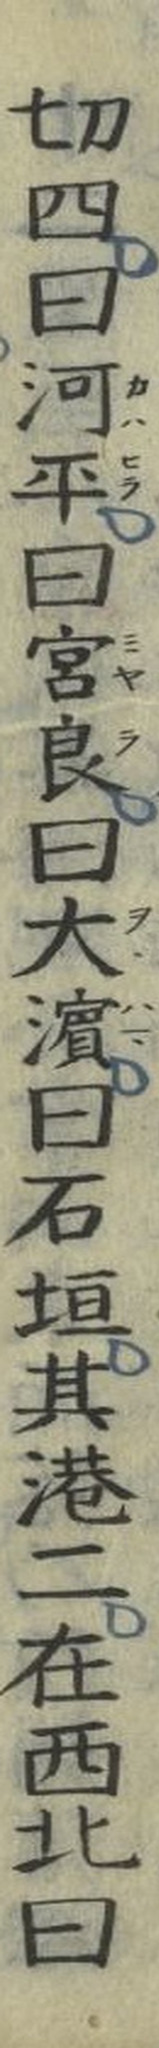切四。曰河平。曰宮良。曰大濵。曰石垣。其港二。在西北曰
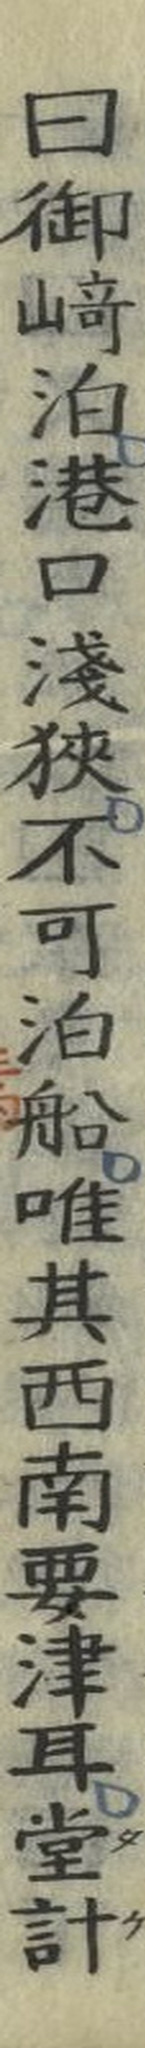曰御﨑泊。港口淺狹。不可泊船。唯其西南要津耳。堂計
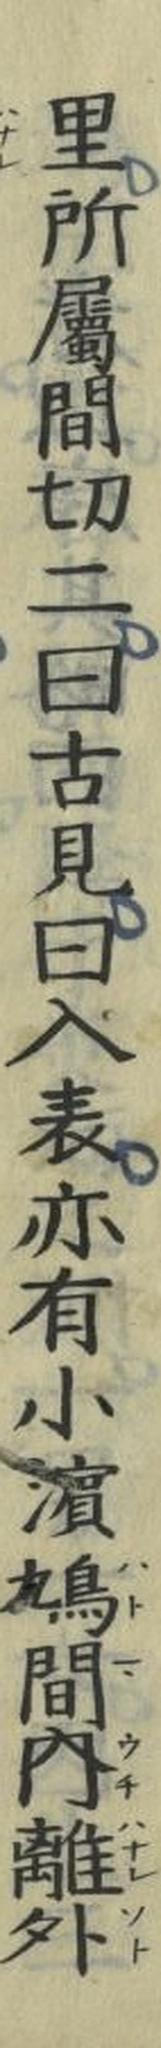里。所屬間切二。曰古見。曰入表。亦有小濵鳩間内離外
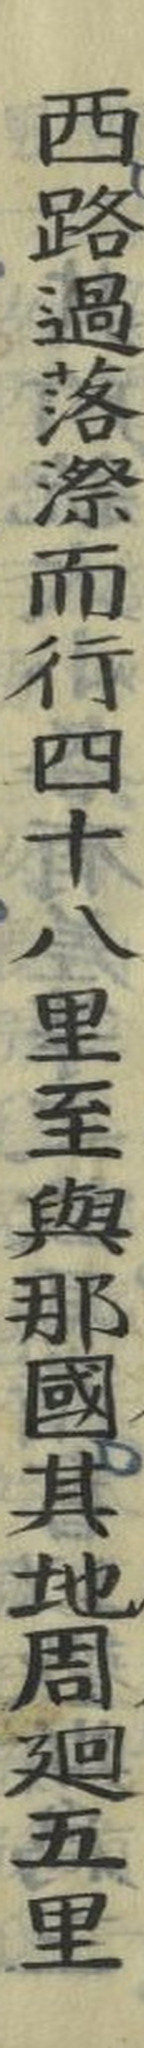西。路過落漈而行四十八里至與那國。其地周廻五里
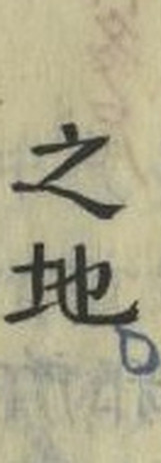之地。
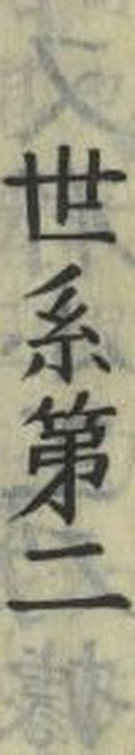世系第二
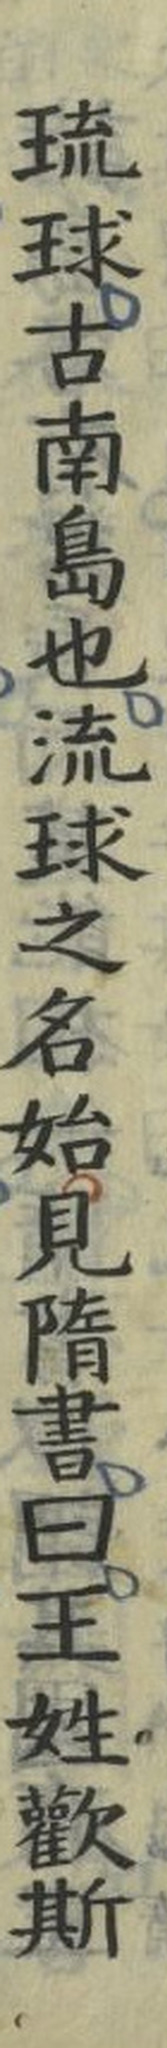琉球。古南島也。流球之名始見隋書。曰。王姓歡斯
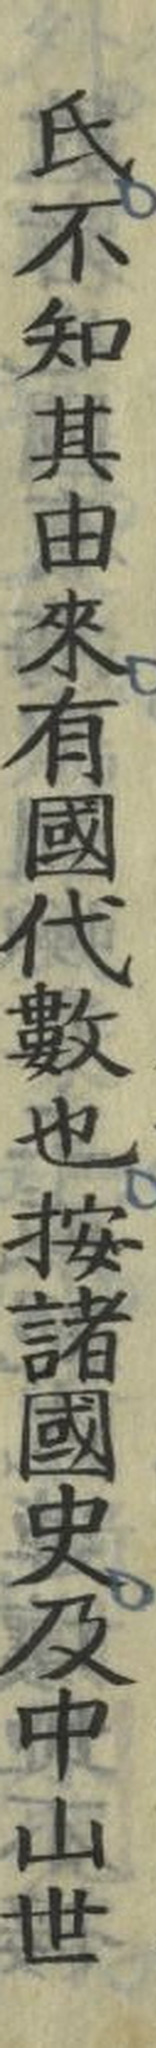氏。不知其由來。有國代數也。按諸國史。及中山世
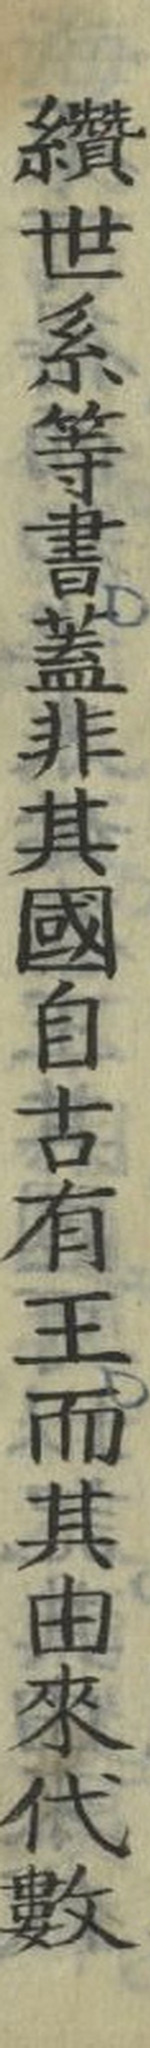纘世系等書。蓋非其國自古有王。而其由來代數

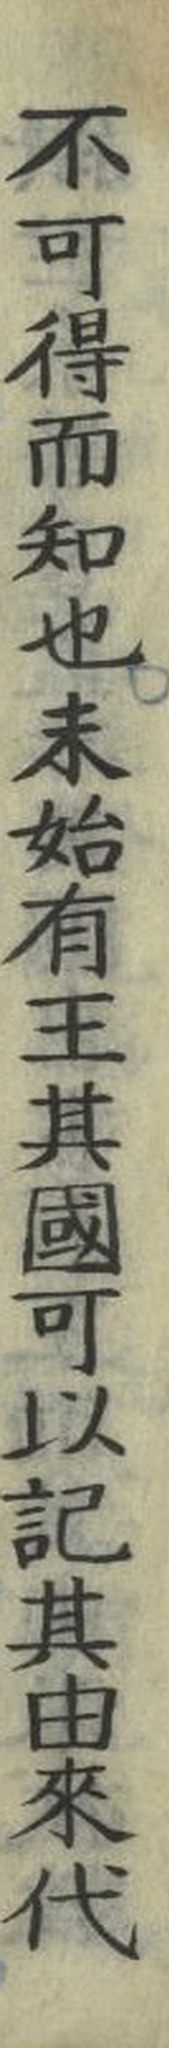不可得而知也。未始有王其國可以記其由來代
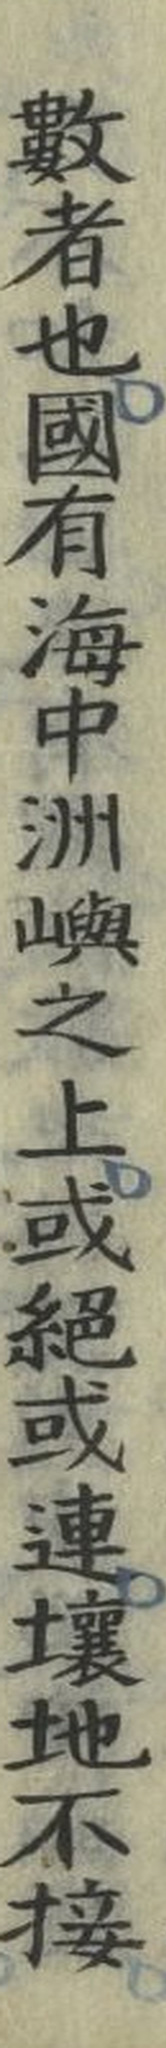數者也。國有海中洲嶼之上。或絕或連。壤地不接。
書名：南島志
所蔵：University of the Ryukyus Library
